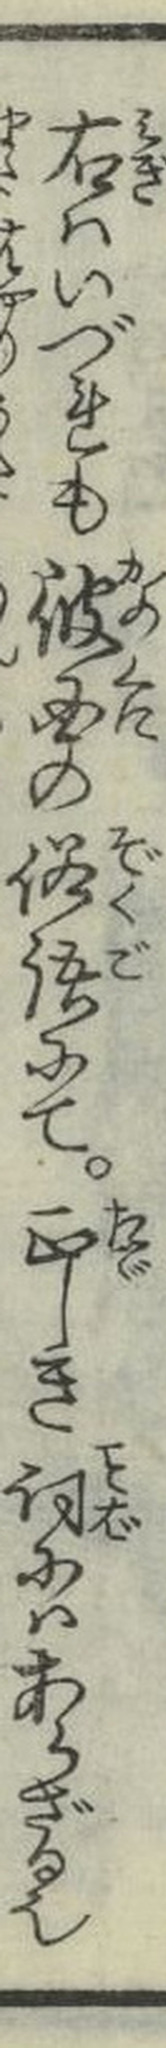右はいづれも彼国の俗語にて。正しき詞にはあらざる也
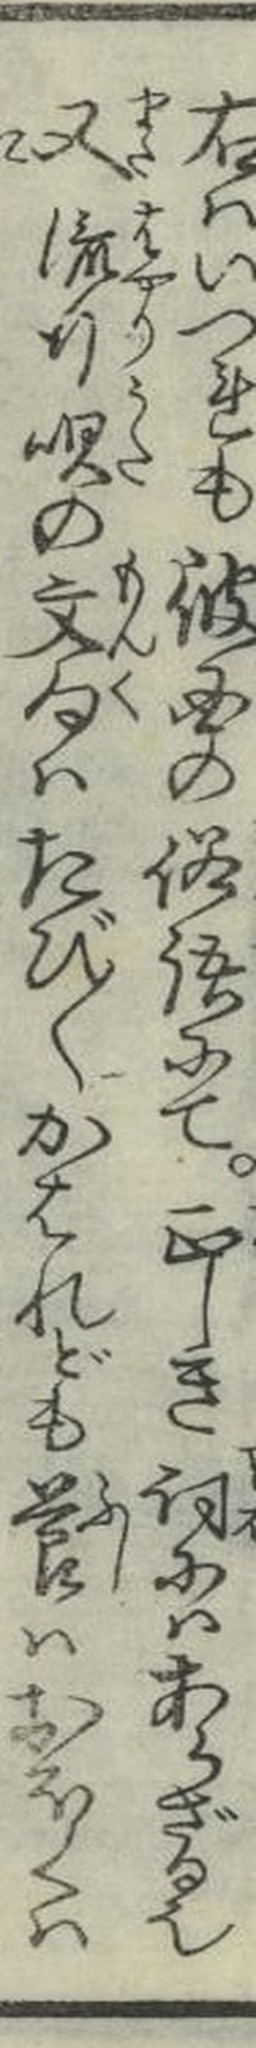又流行唄の文句はたび〳〵かはれども節はおほくは
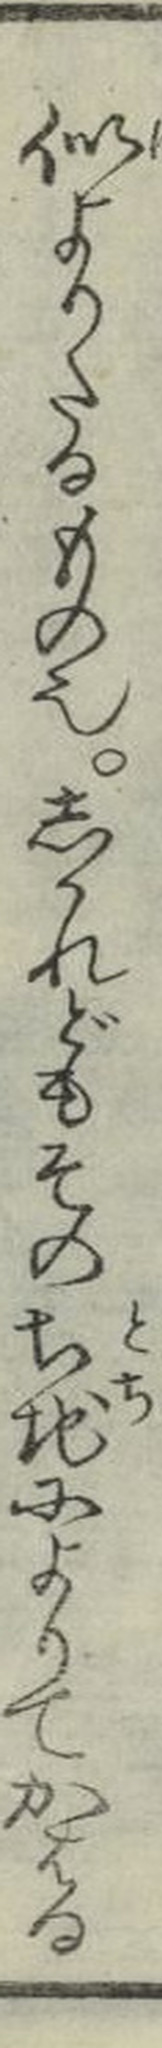似よりたるもの也。しかれどもその土地によりてかはる
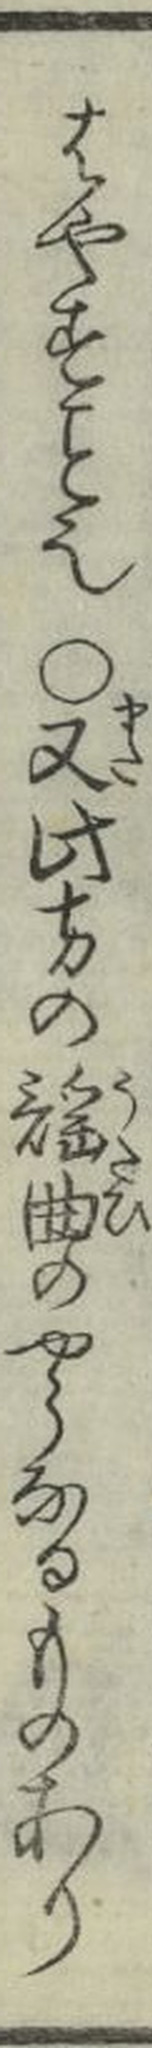はやすこと也○又此方の謡曲のやうなるものあり
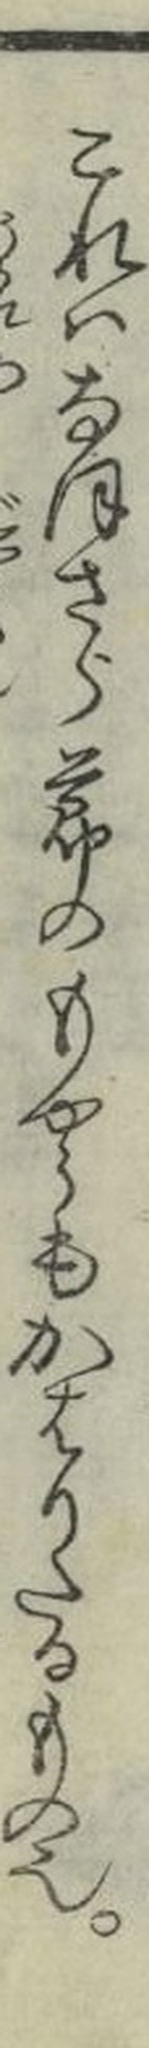これはなほさら節のもやうもかはりたるもの也。

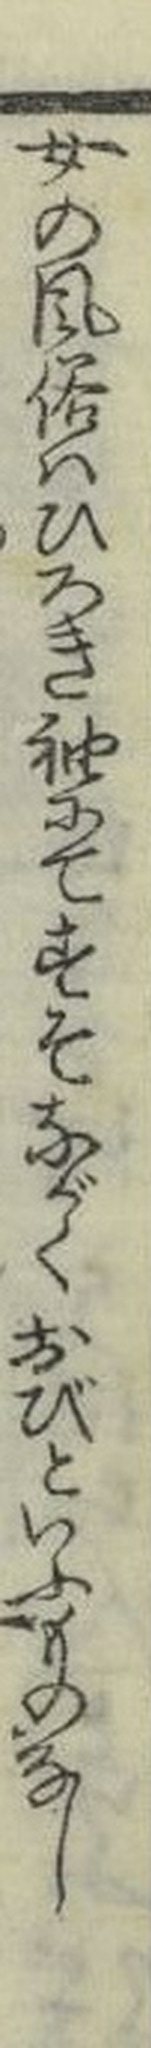女の風俗はひろき袖にてすそながくおびといふものなし
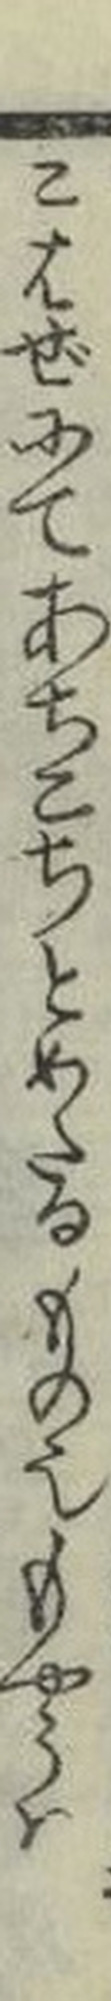こはぜにてあちこちとめたるもの也もやうは
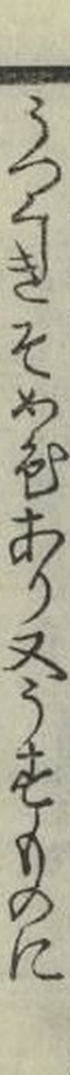うつくしきそめ色あり又うすものに
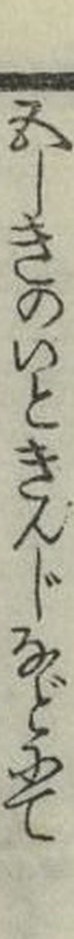五しきのいときんじなどにて
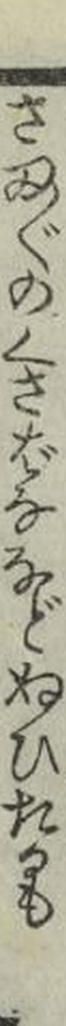さま〴〵のくさばななどぬひたるも
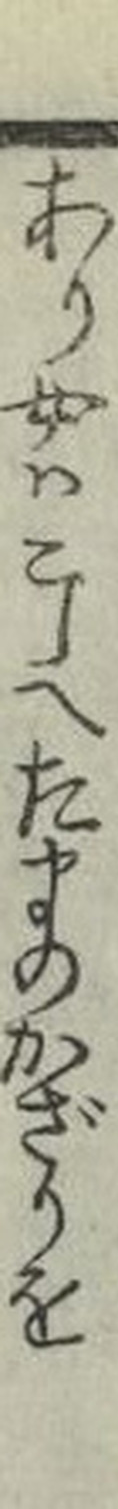あり女はこしへたまのかざりを
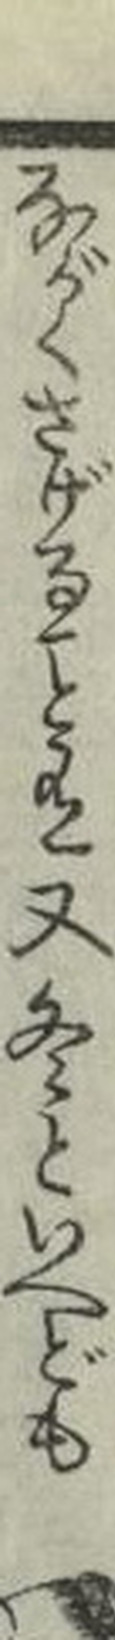ながくさげること有又冬といへども
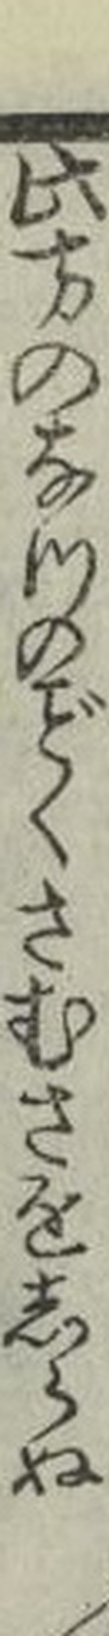此方のなつのごとくさむさをしらぬ
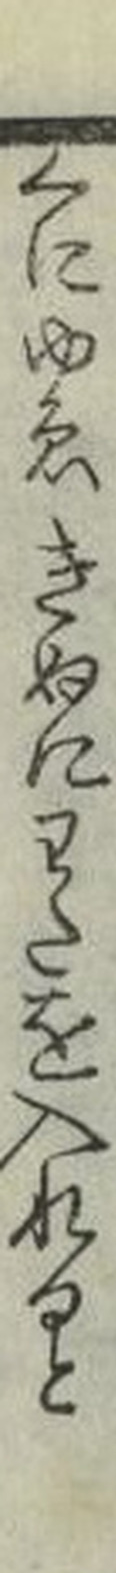くにゆゑきぬにわたを入れると
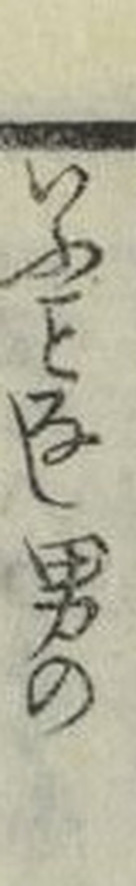いふことなし男の
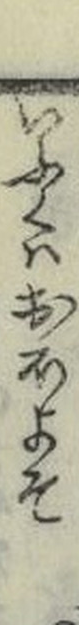いふくはおほよそ
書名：琉球奇譚
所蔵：University of the Ryukyus Library
